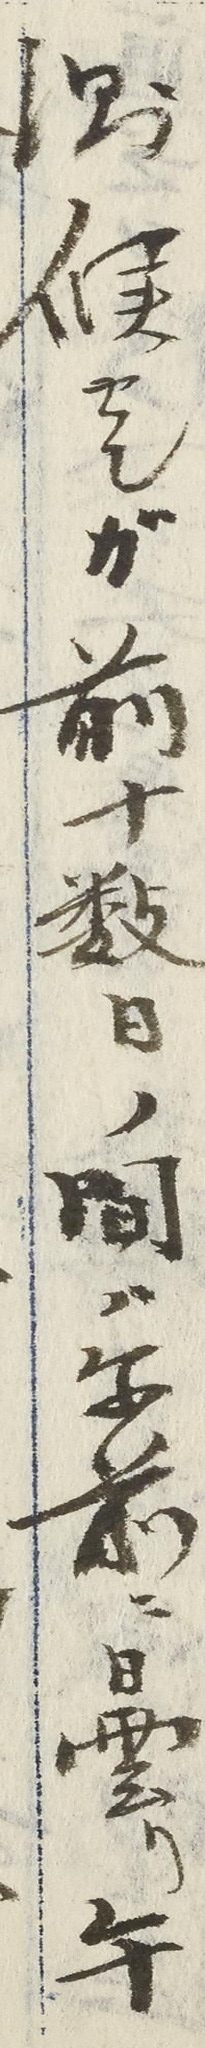測候セシガ前中数日ノ間ハ午前ニ曇リ午
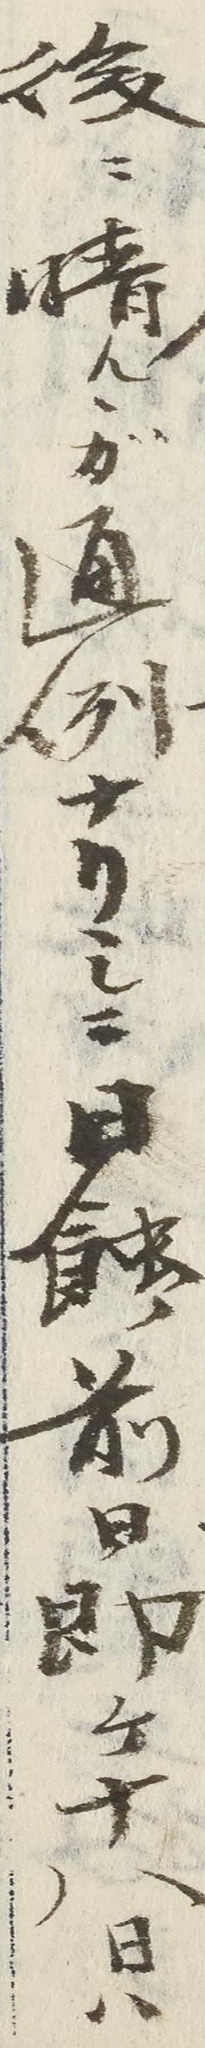後ニ晴ルガ通例ナリシニ日蝕ノ前日即チ十八日ハ
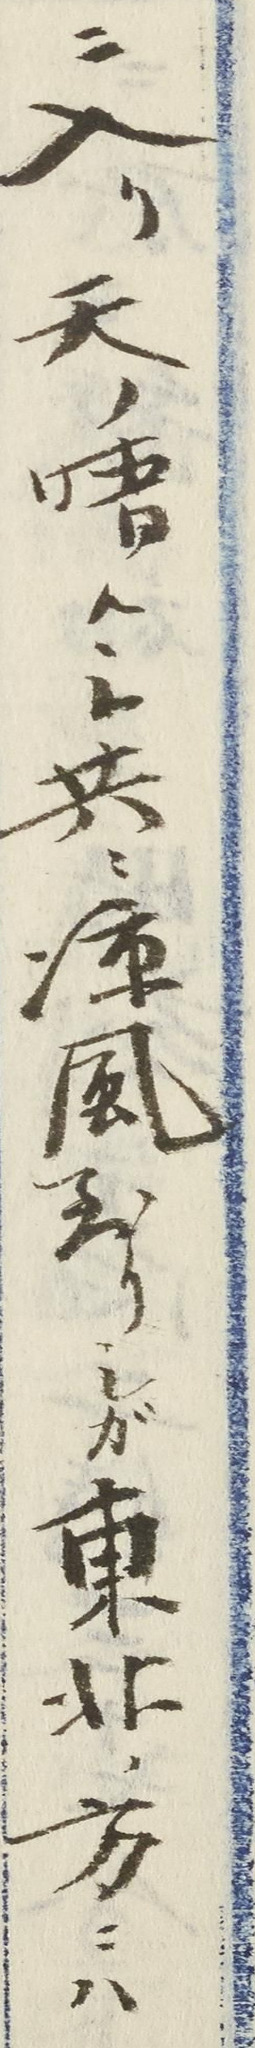ニ入リ天ノ晴ルト共ニ涼風至リシガ東北ノ方ニハ
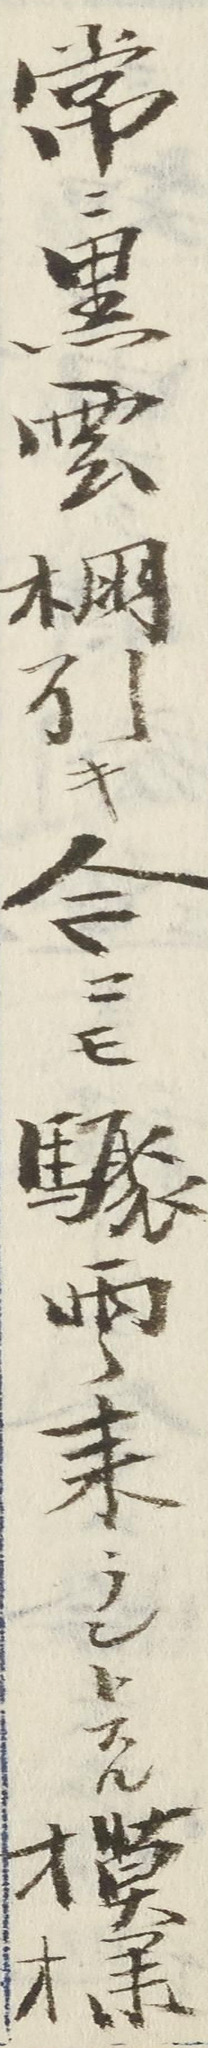常に黒雲棚引キ今ニモ驟雨ノ来ラントイスル模様
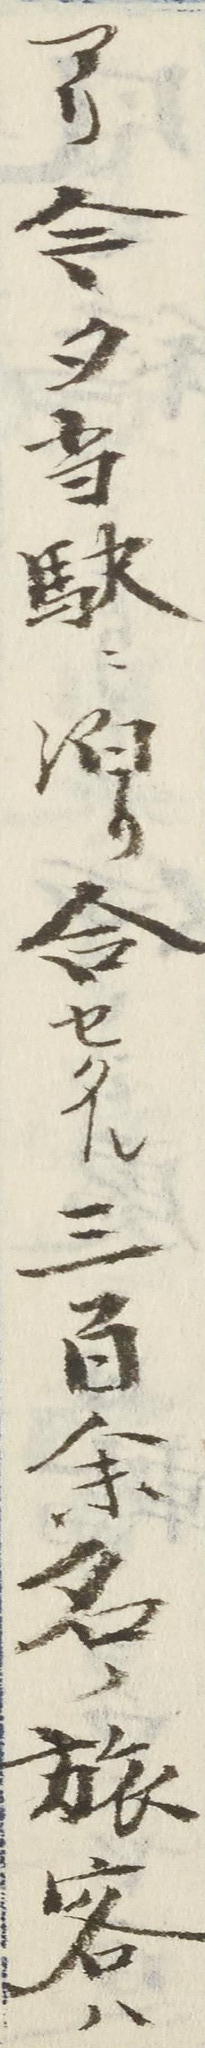アリ今夕当駅ニ泊リ合セタル三百余名ノ旅客ハ
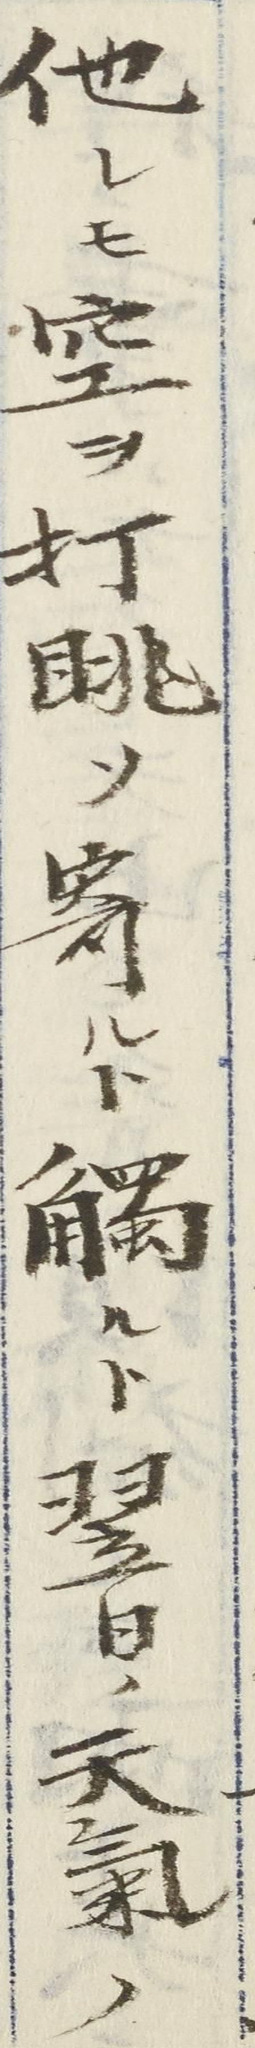他レモ空ヲ打眺メ寄ルト触ルト翌日ノ天気ノ
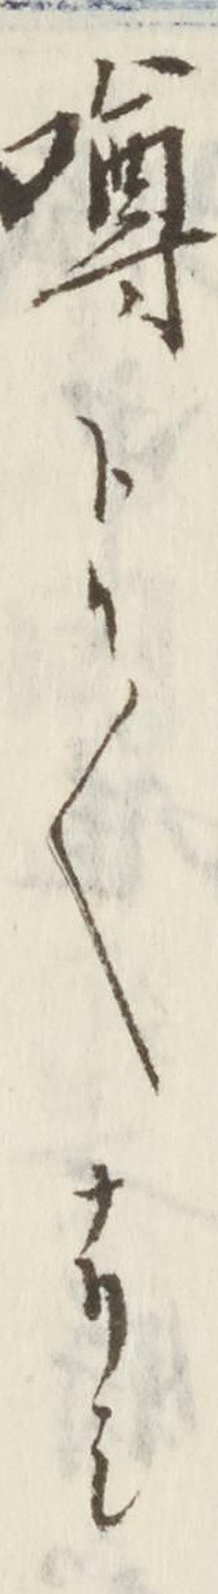噂トリ〳〵ナリシ
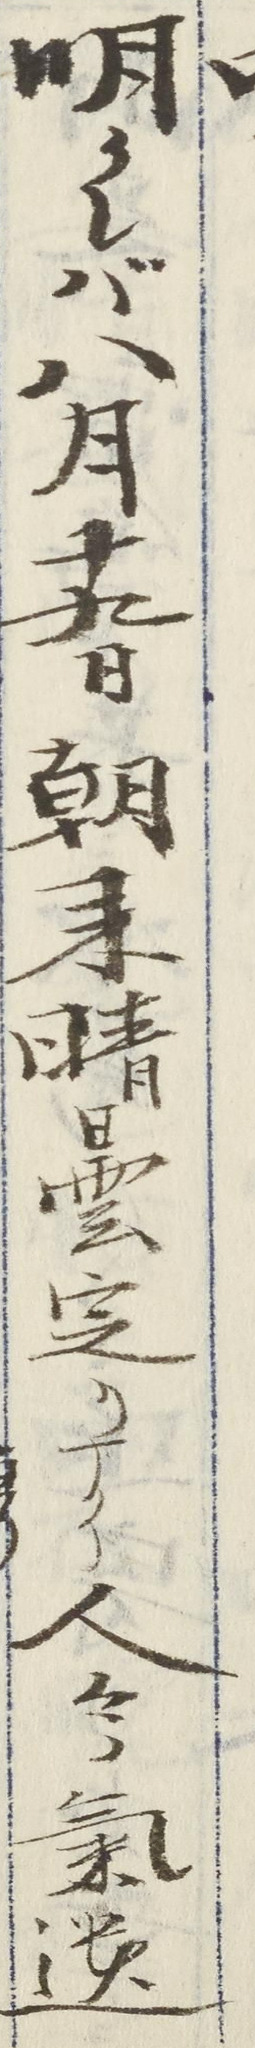明ケレバ八月十九日朝来晴曇定リケリ人々ノ気遣
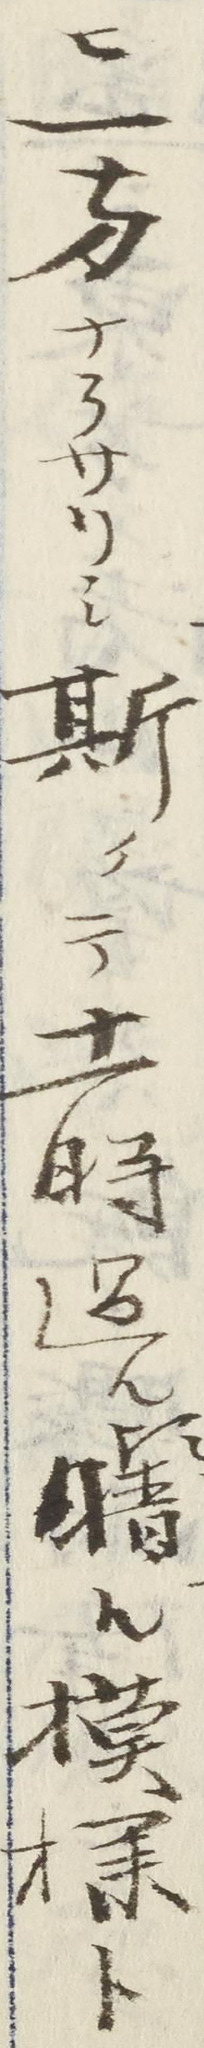モ一方ナラサリシ斯クテ十一時過ル頃ヨリ晴ル模様ト
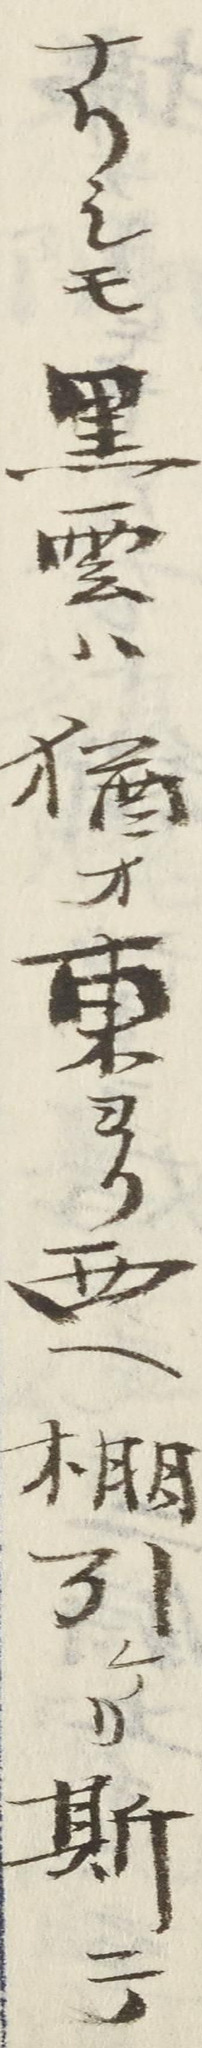ナリシモ黒雲ハ猶オ東ヨリ西ヘ棚引ケリ斯テ
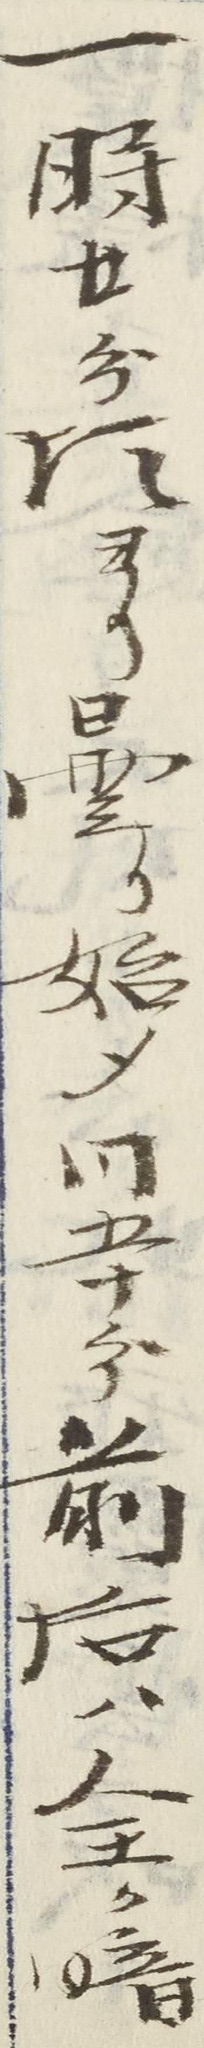一時廿分頃ヨリ曇リ始メ同五十分前后ハ全ク暗
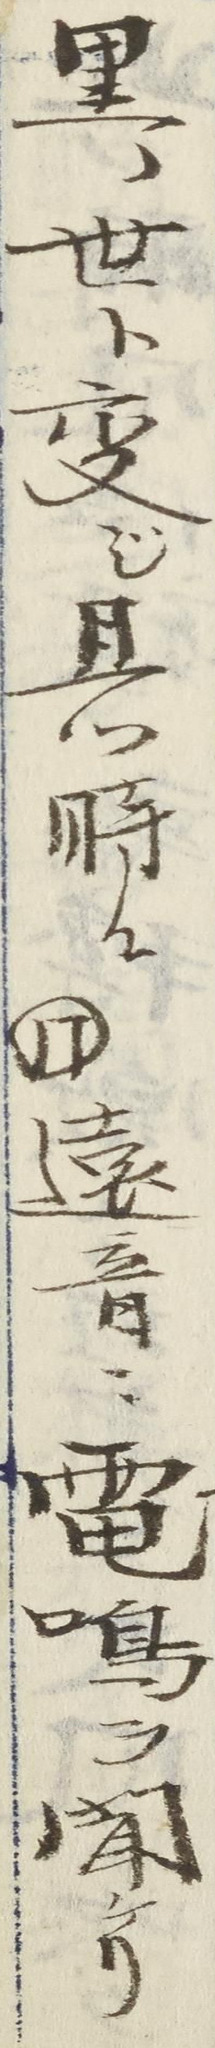里ノ世ト変ジ且ツ時々遠音ニ雷鳴ヲ聞ケリ

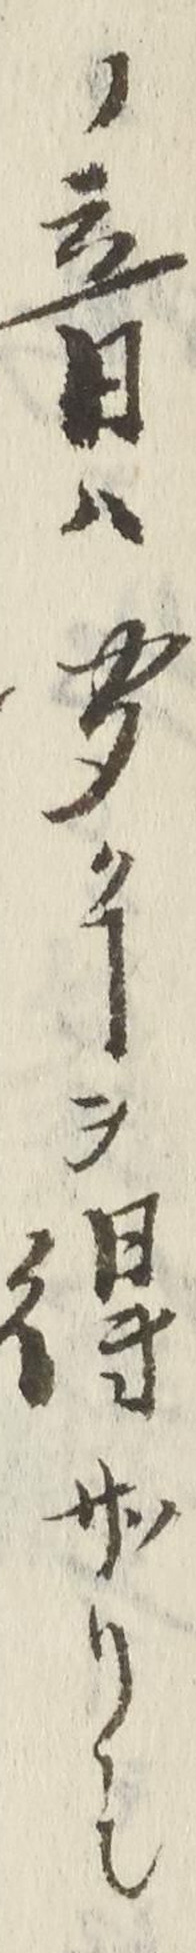ノ音ハ聞クコトヲ得ザリシ
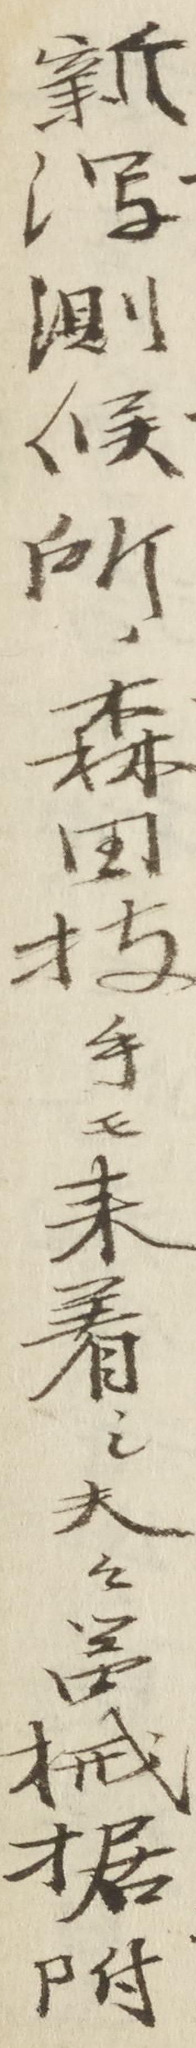新潟測候所ノ森田技手モ来着シ夫々器械据付
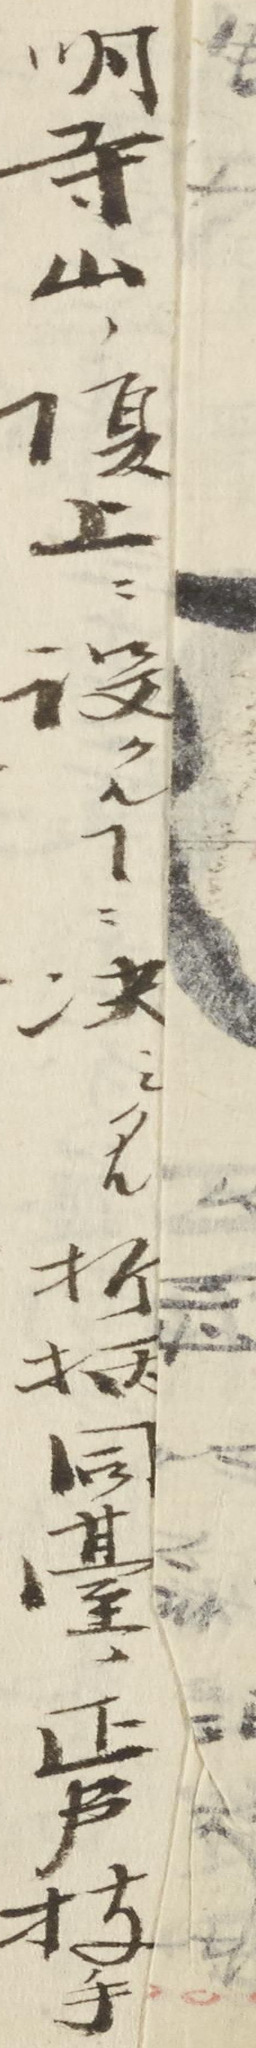明寺山ノ頂上ニ設クルコト二決シタル折柄同台ノ正戸技手

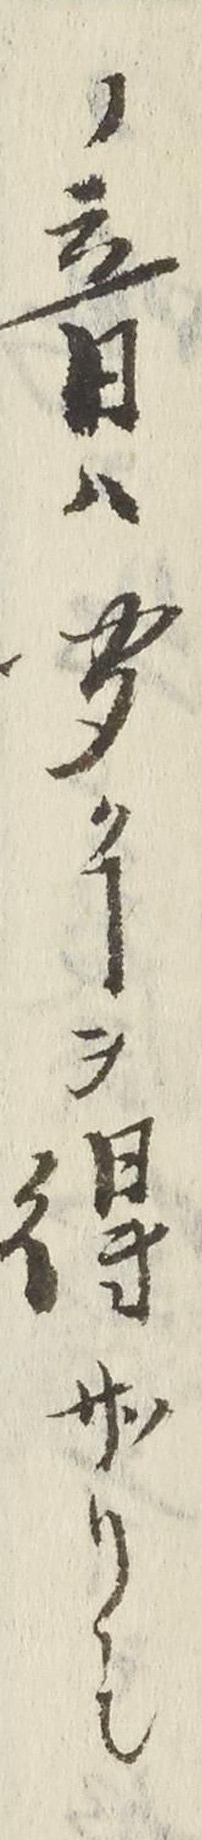ノ音ハ聞クコトヲ得ザリシ
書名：日蝕録　全
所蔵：東京大学地震研究所図書室 Earthquake Research Institute Library, The University of Tokyo, JAPAN
